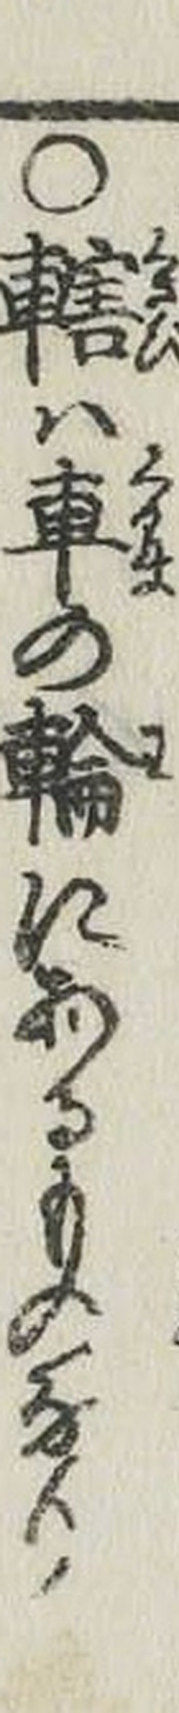○轄は車の輪にあるものなり
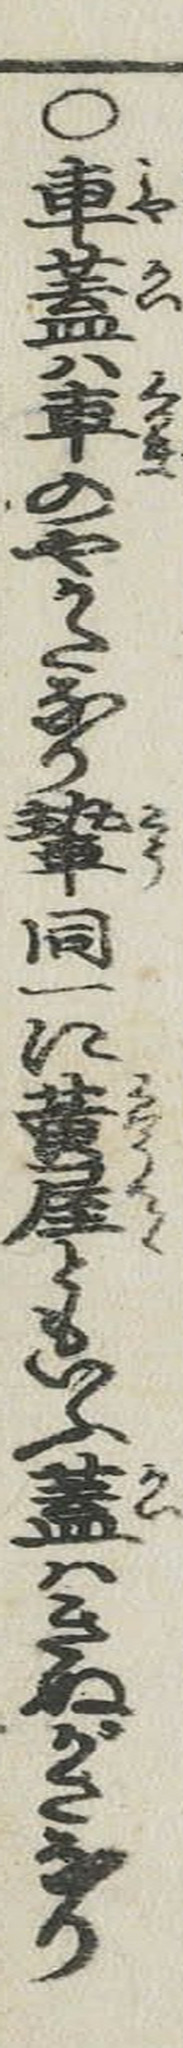○車蓋は車のやかたなり𨎐同一に黄屋ともいふ蓋はきぬがさなり

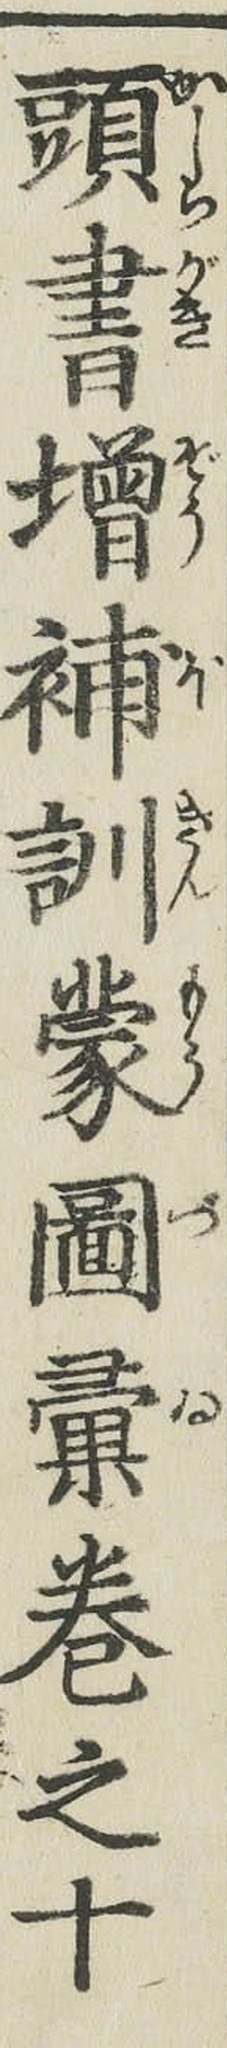頭書増補訓蒙図彙巻之十
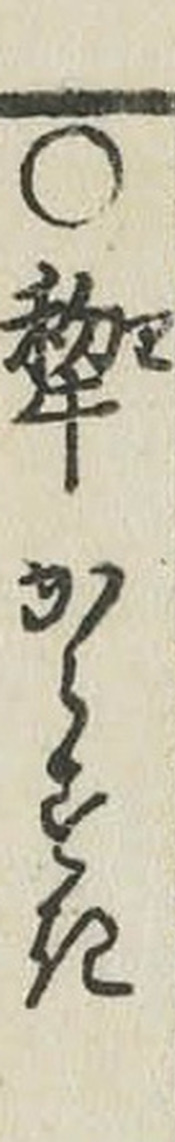○犂からすき
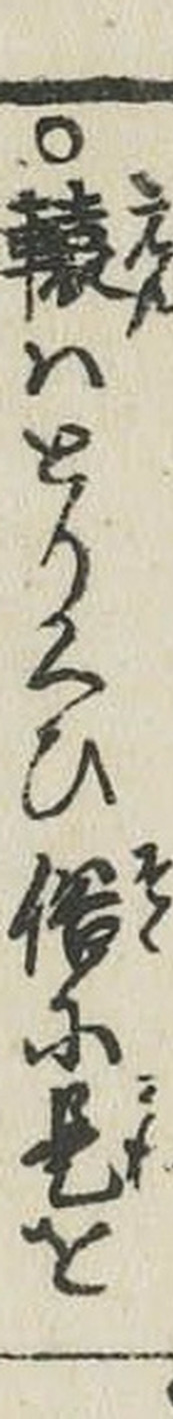轅はとりくひ俗に是を
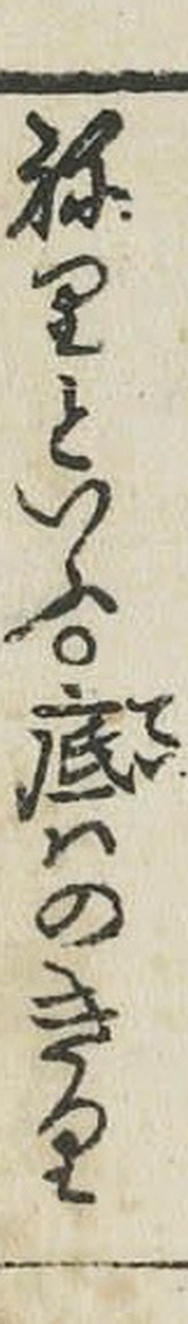ねりといふ底はのきり
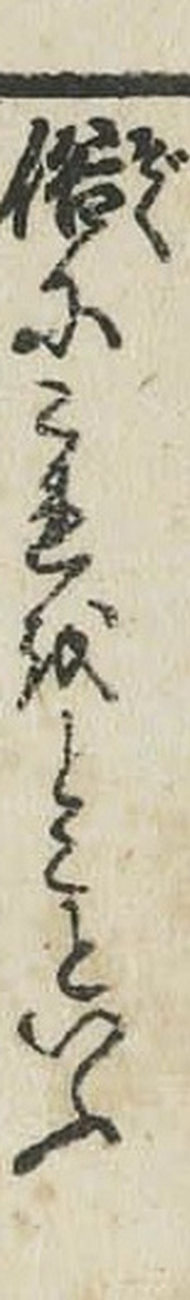俗にこれをとこといふ
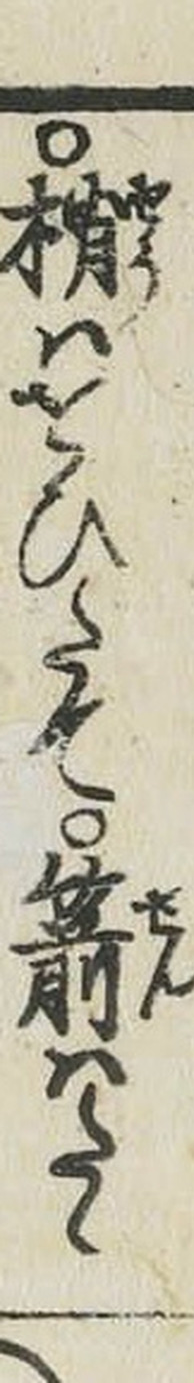梢はをひたて箭はたゝ
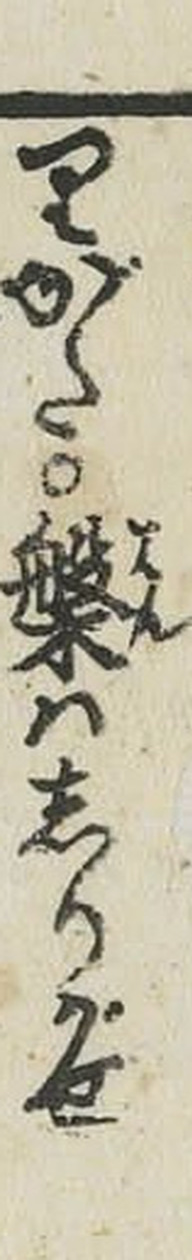りがた槃はしりがせ
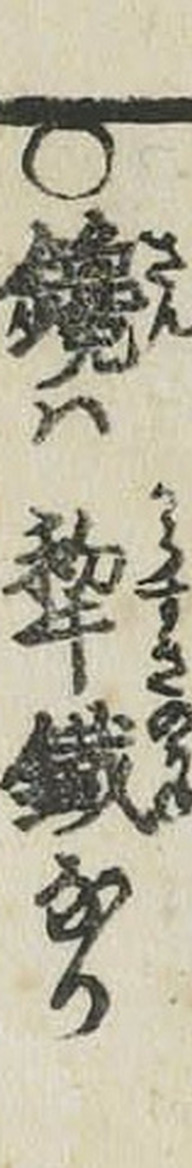○鑱は犂鉄なり
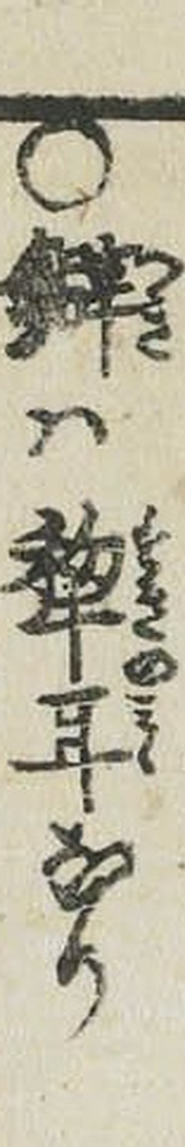○鐴は犂耳なり
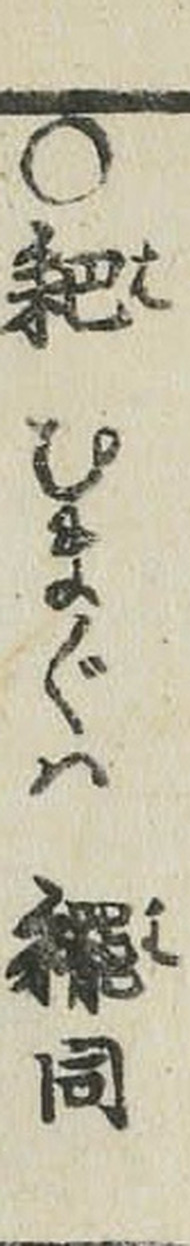○耙むまぐは▢同

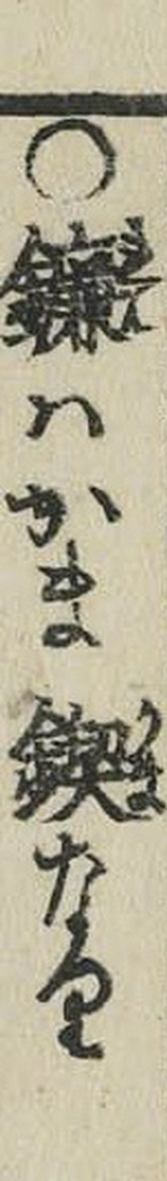○鎌はかま鍥なり
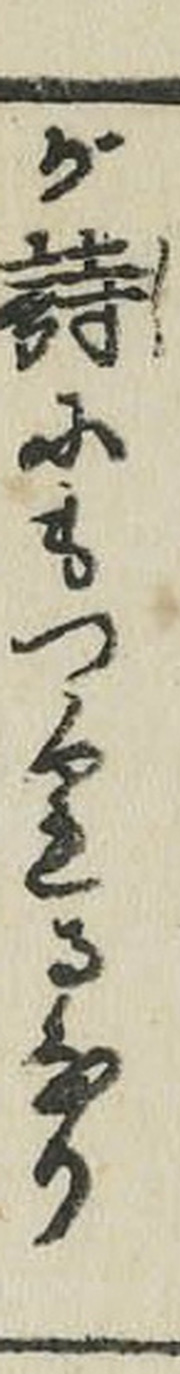が詩にもつくれるなり
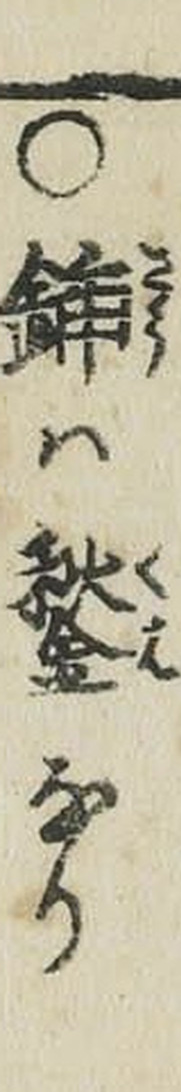○鍤は鍫なり
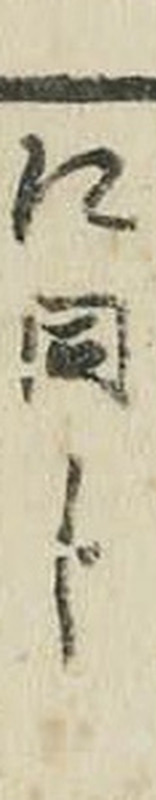に同じ
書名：増補頭書訓蒙図彙大成 10巻 5:巻之9-11
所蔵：東京学芸大学教育コンテンツアーカイブ
